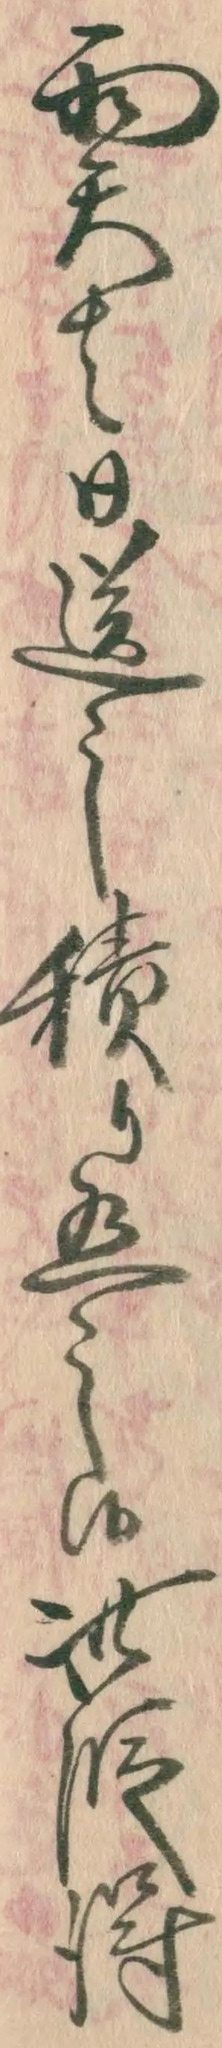雨天は日送之積り有之候此段得
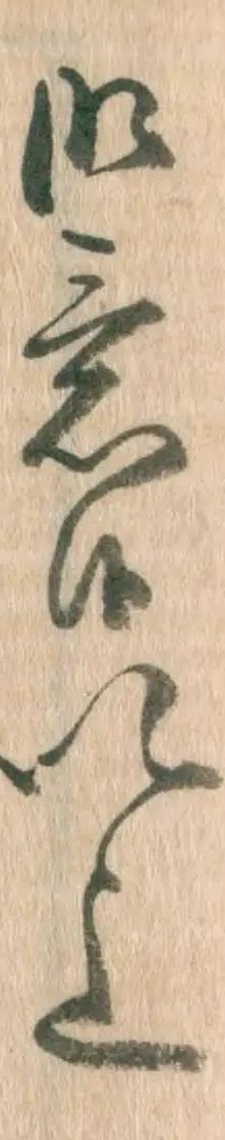御意候以上
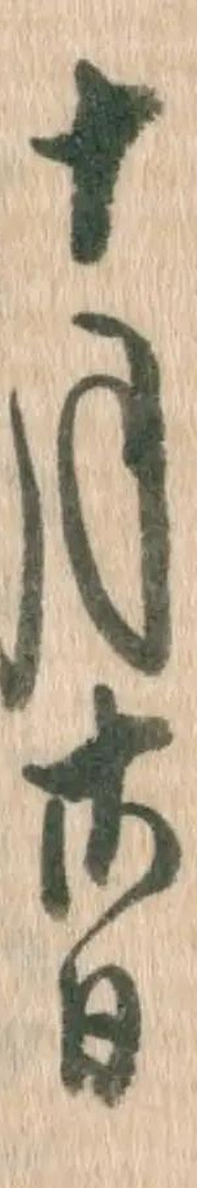十月廿日

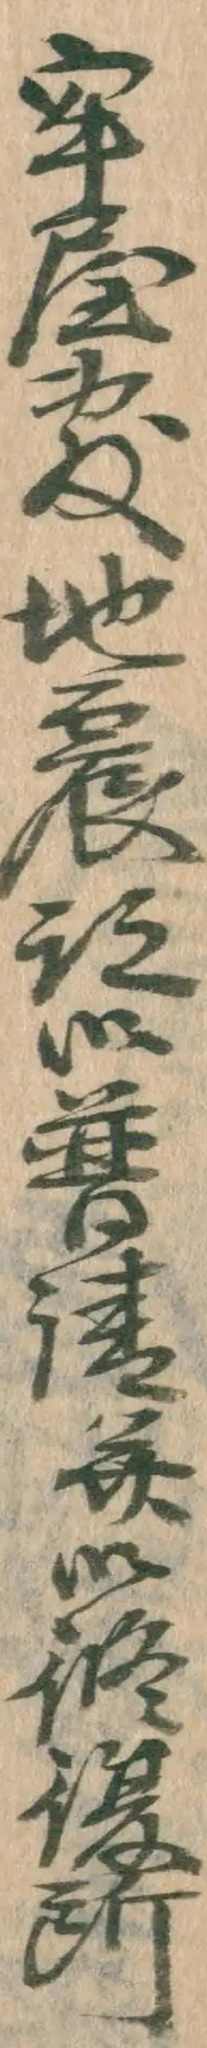│牢屋敷地震跡御普請幷御修復所
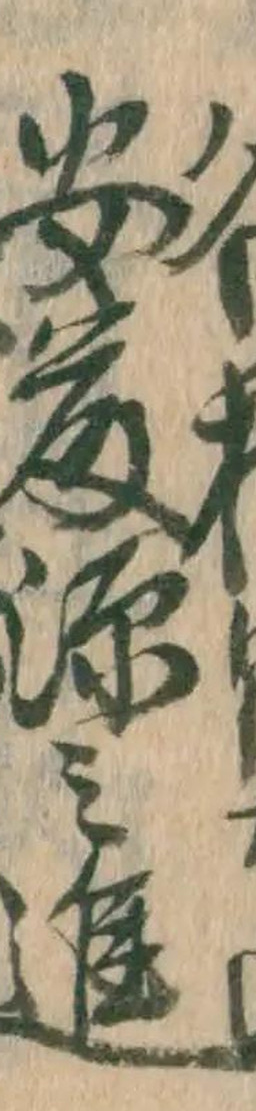│安藤源之進
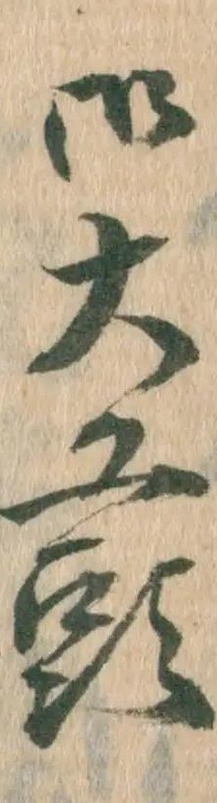御大工頭
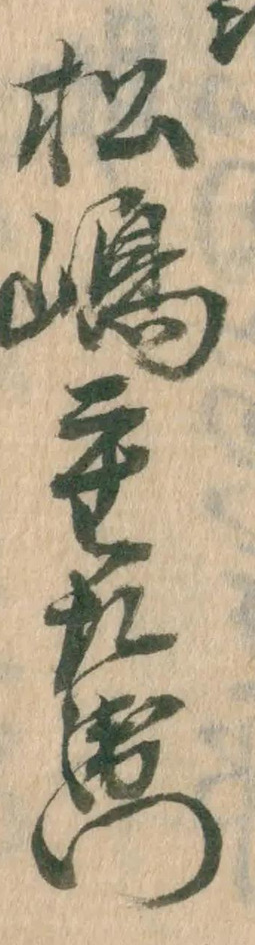松島重左衛門
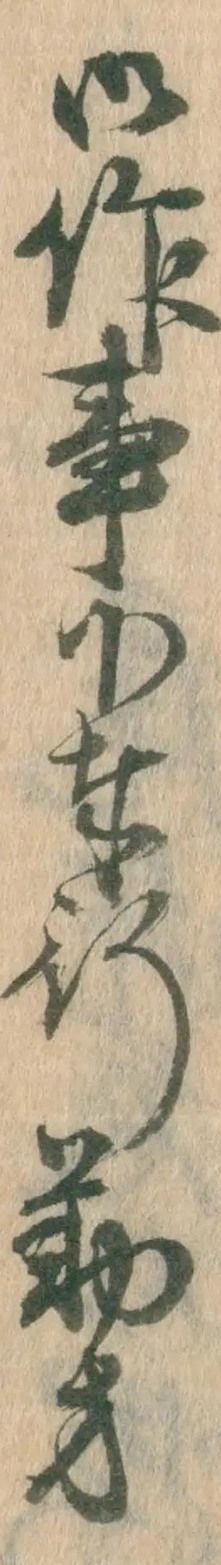御作事下奉行勤方

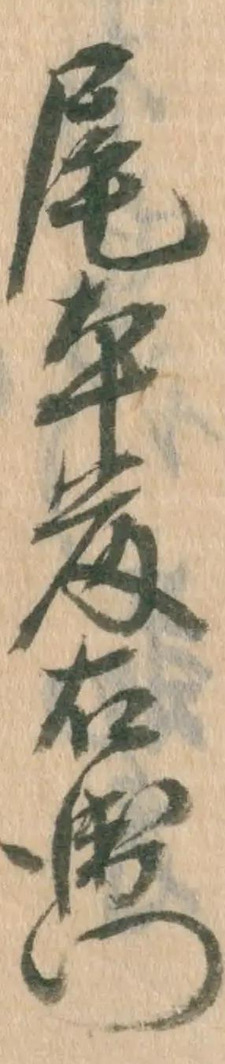尾牛藤右衛門
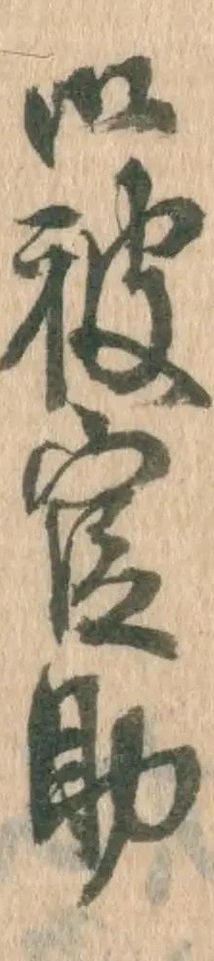御被官助
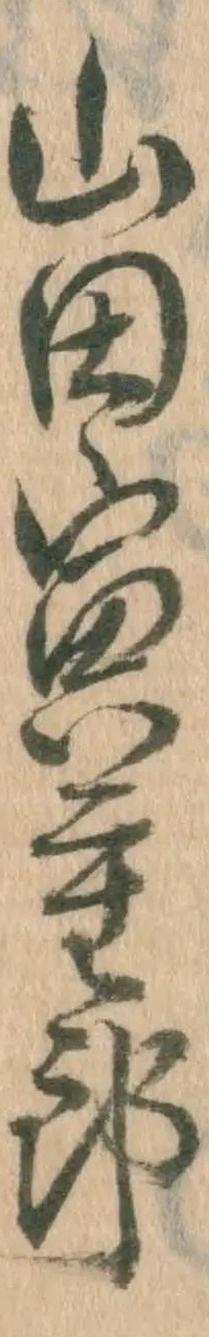山田寅重郎
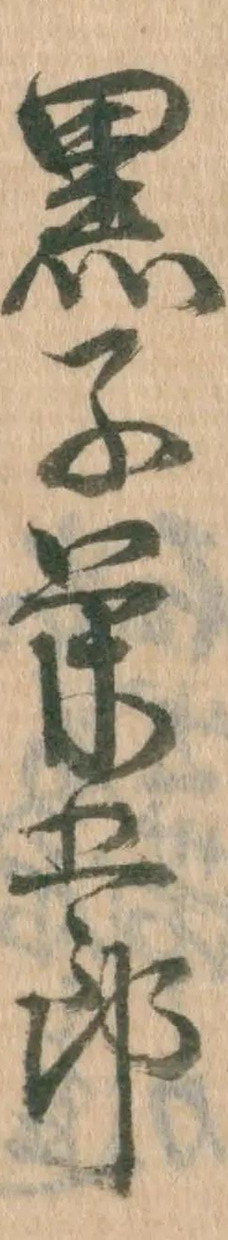黒子栄工郎
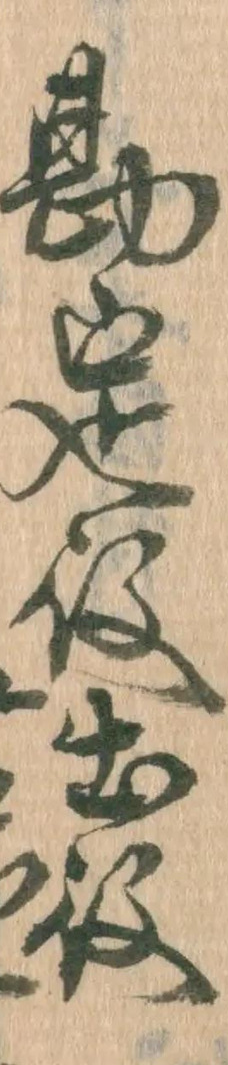勘定役出役
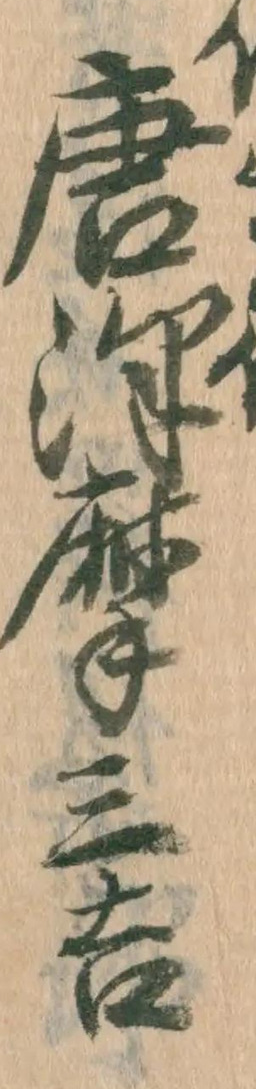唐沢摩三吉
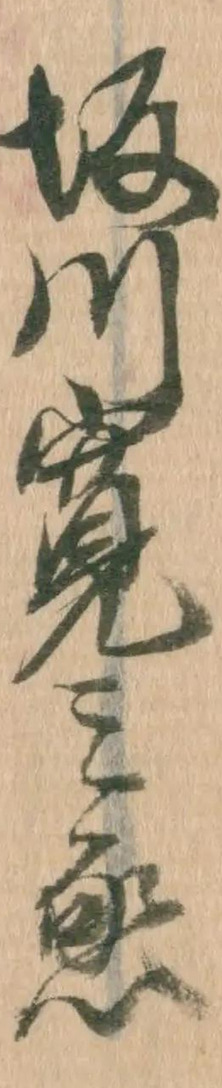坂川寛之丞
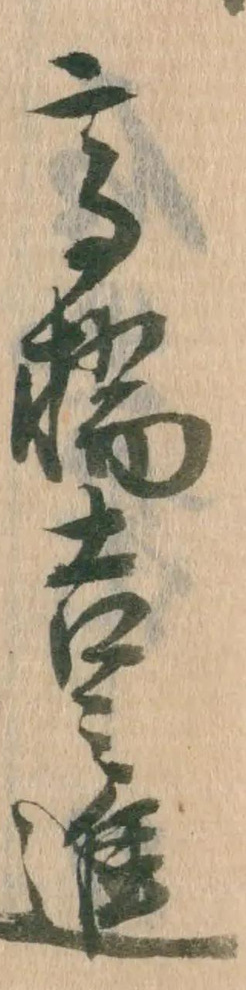高橋吉之進
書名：七十冊物類集 71巻. [44] 四十三 牢屋敷御普請御修覆地震ニ付骨折候牢屋掛御褒美之部
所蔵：国立国会図書館 National Diet Library, JAPAN
